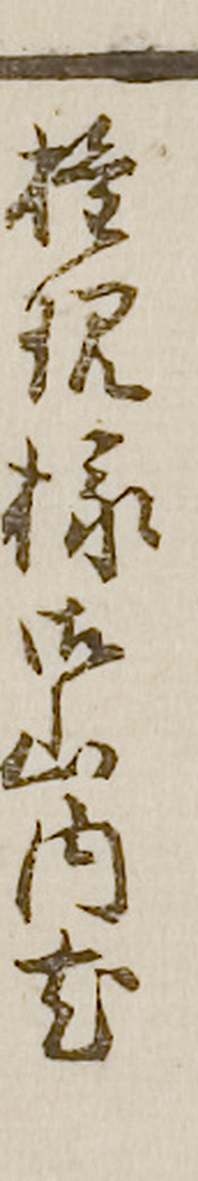権現様御山内尤
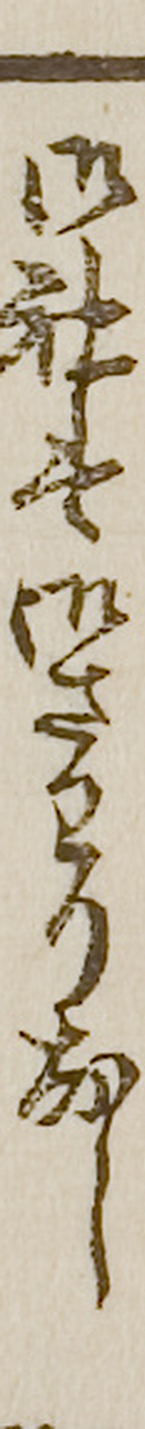御社は御さわりなし
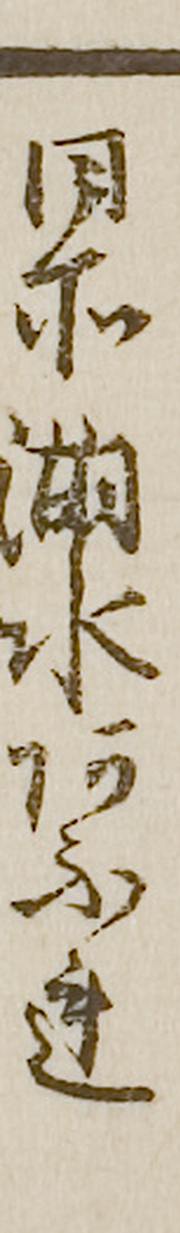同所湖水あふれ
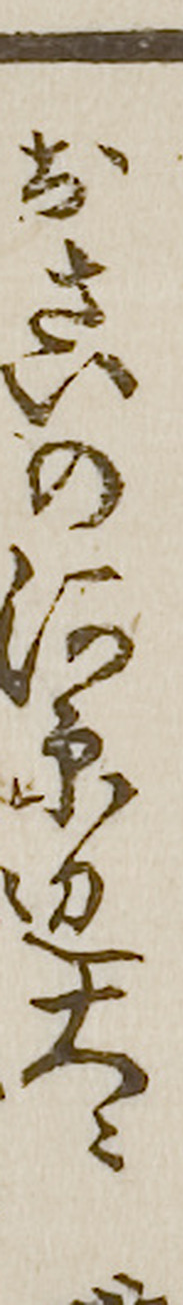出さいの河原辺大に
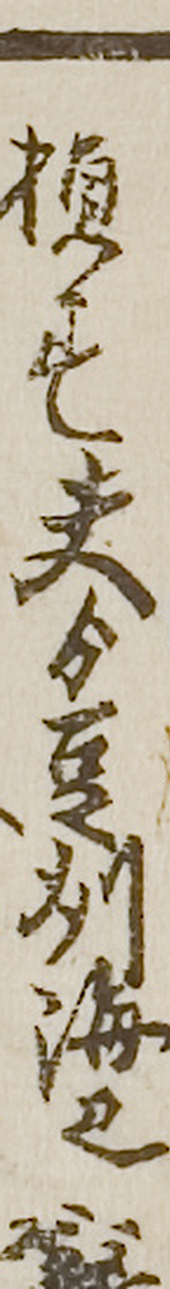損す夫より豆州海辺
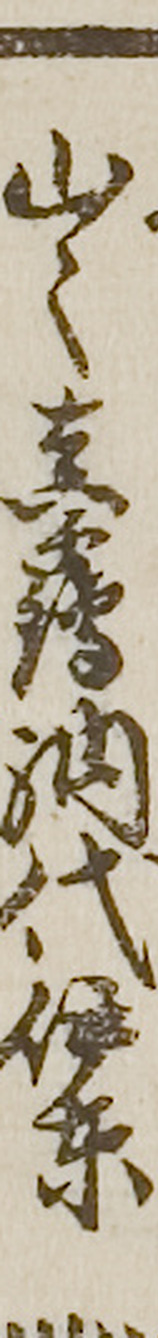山々真鶴網代伊東
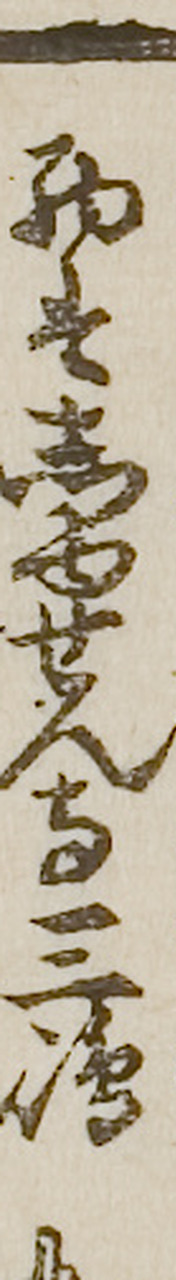西はしゆせん寺三嶋
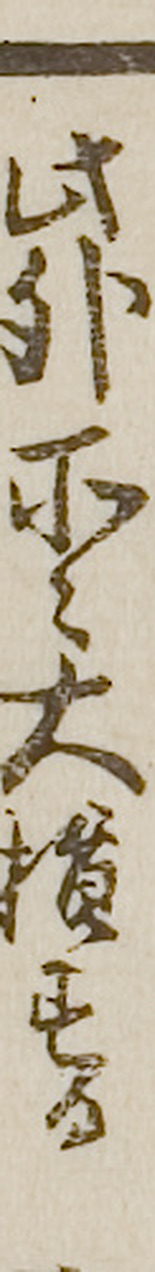此外所々大損する
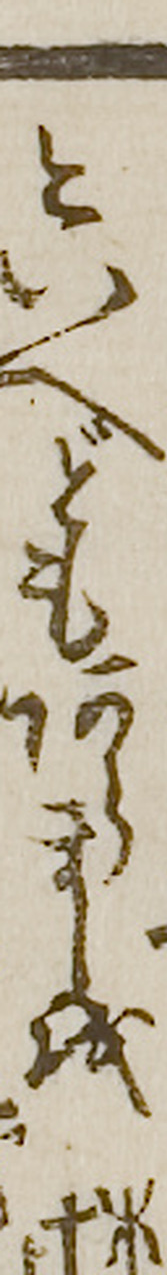といへどもあらましを
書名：[嘉永六丑年二月二日相州地震]
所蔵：東京大学総合図書館 General Library in the University of Tokyo, JAPAN
